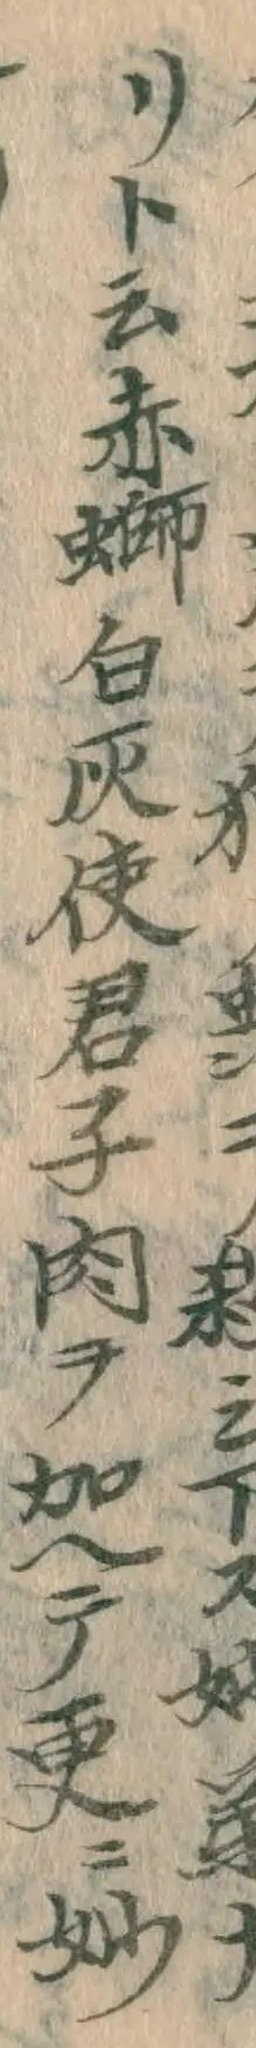リト云赤螄白灰使君子肉ヲ加ヘテ更ニ妙
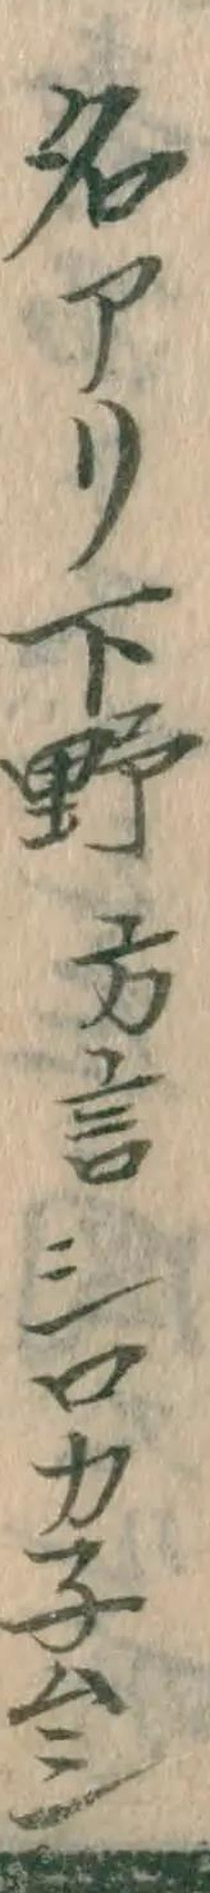名アリ下野方言シロカネムシ
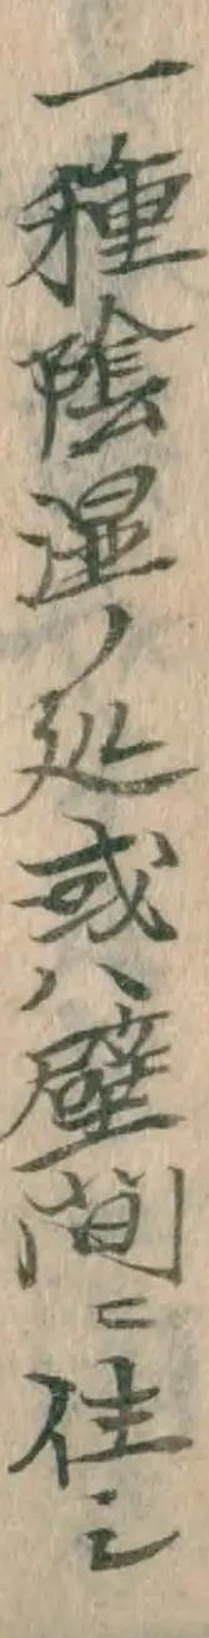一種陰湿ノ処或ハ壁間ニ住シ
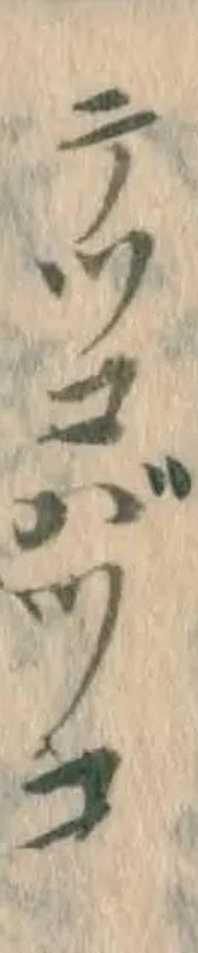テツコバツコ
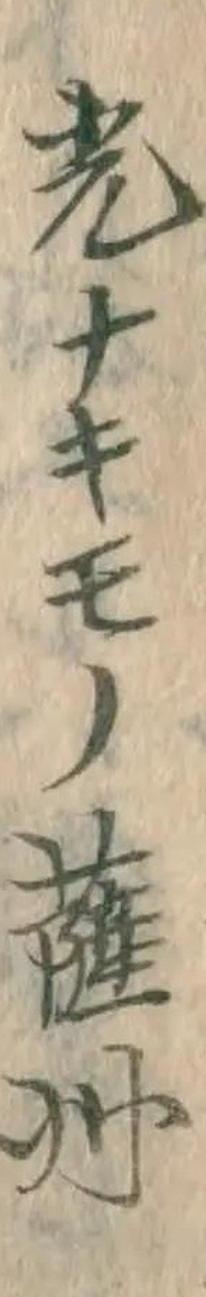光ナキモノ薩州
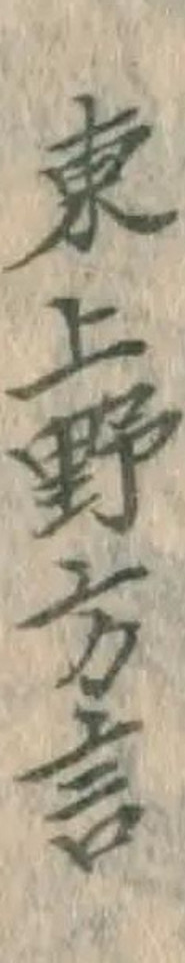東上野方言
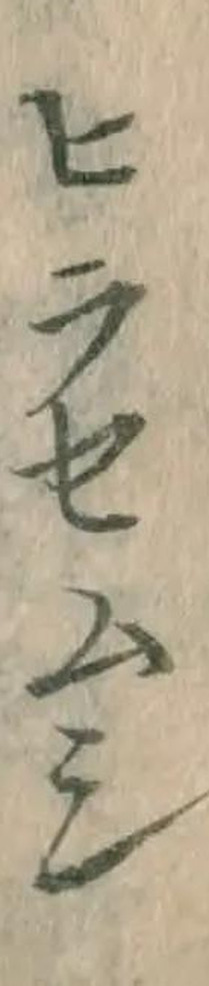ヒラセムシ

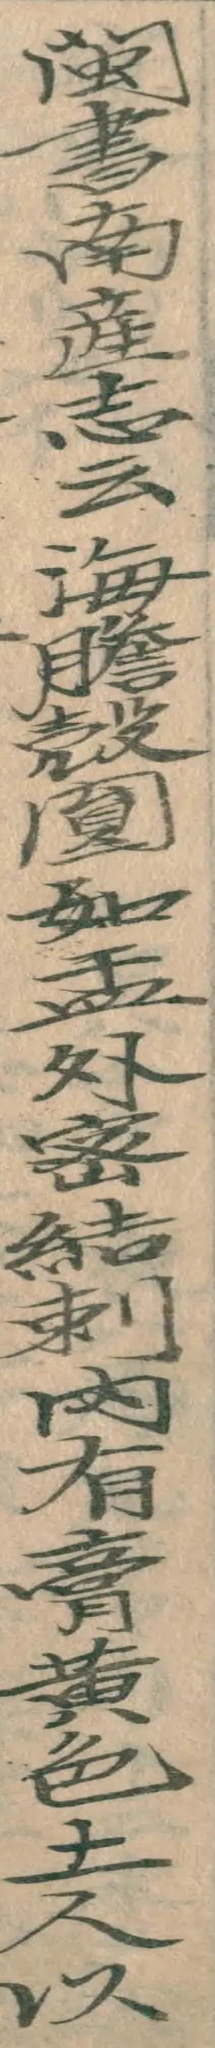閩書南産志云海膽殻圓如盂外密結刺内有膏黄色土人以
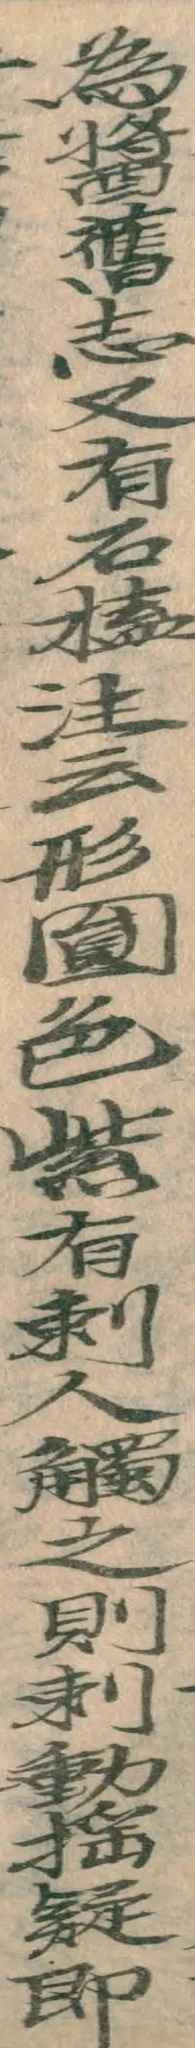為醤舊志又有石榼注云形圓色紫有刺人觸之則刺動揺疑即
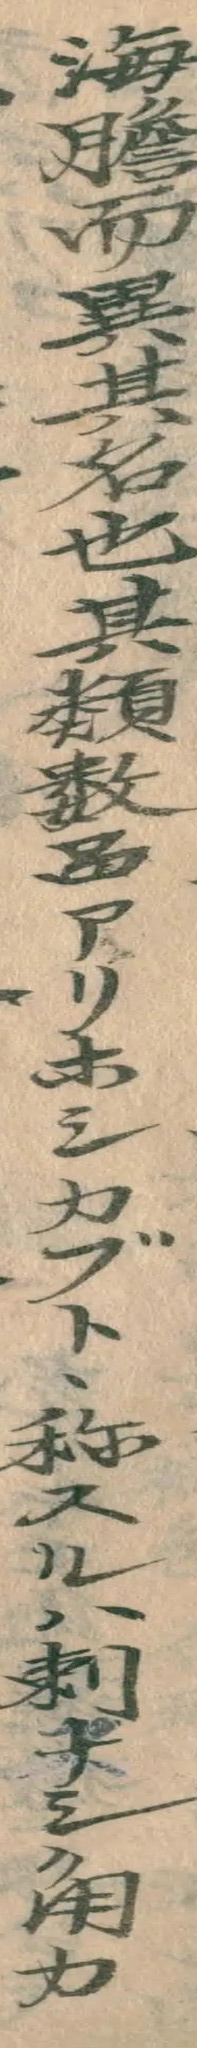海膽而異其名也其類数品アリホシカブトヽ称スルハ刺ナシ角カ
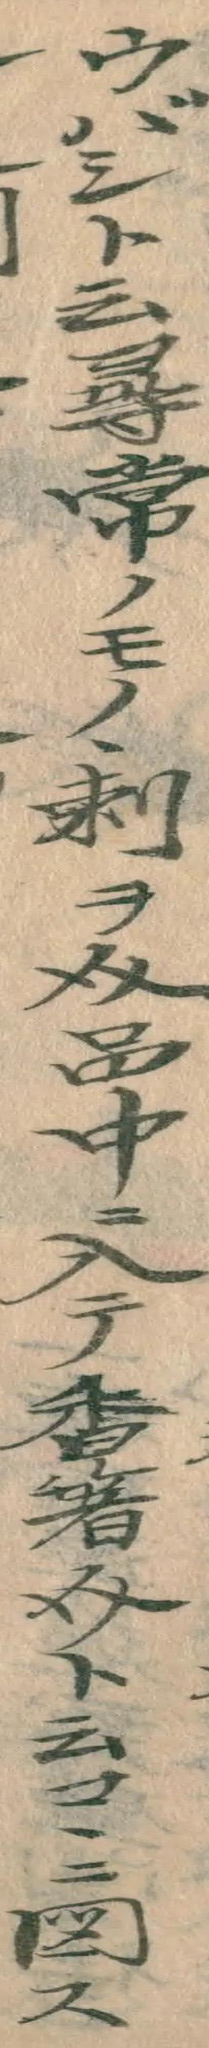ウバシト云尋常ノモノヽ刺ヲ介品中ニ入テ香箸介ト云コヽニ図ス
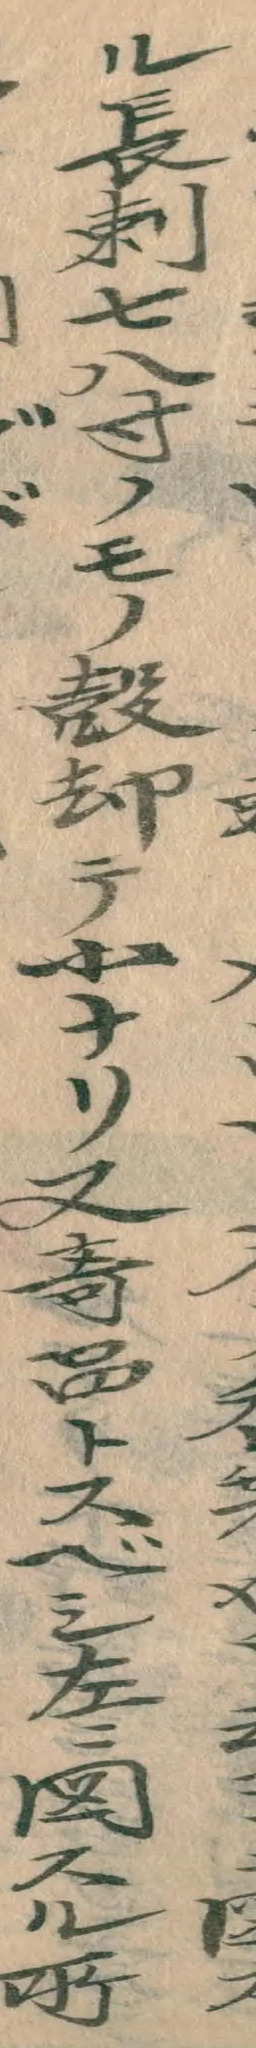ル長刺七八寸ノモノ殻却テ小ナｒナリ又奇品トスベシ左ニ図スルト所
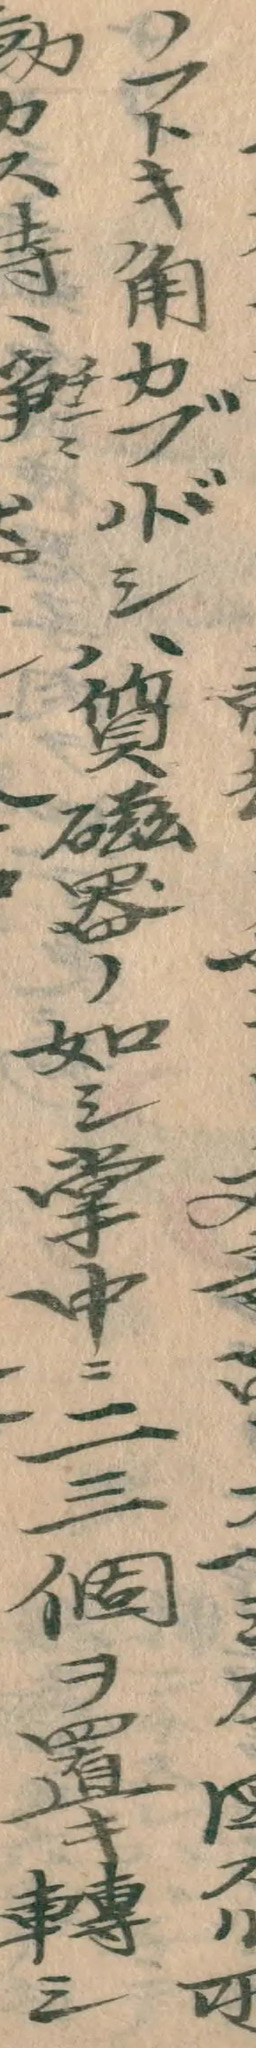ノフトキ角カブトバシハ質磁器ノ如シ掌中ニニ三個ヲ置キ轉シ
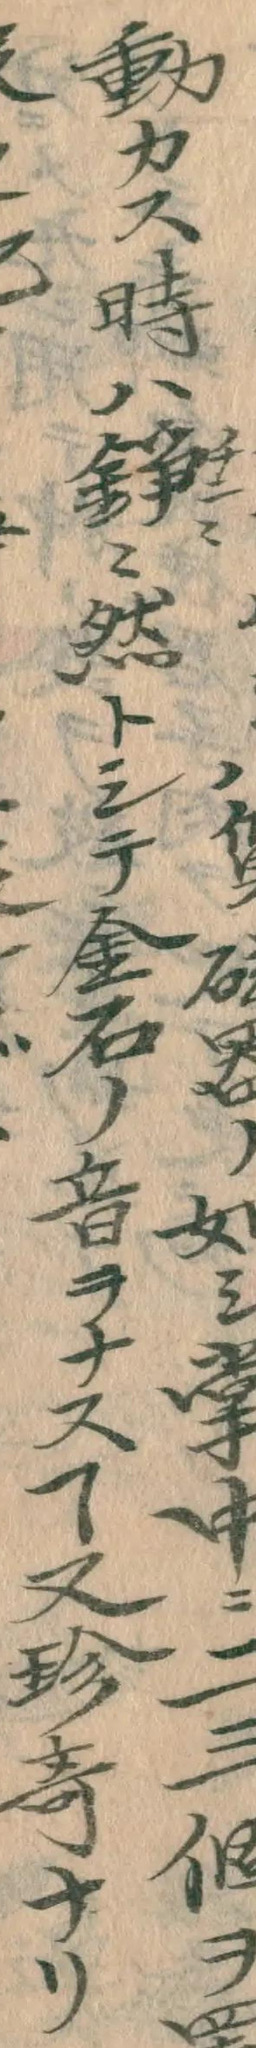動カス時ハ錚々然トシテ金石ノ音ヲナスコト又珍奇ナリ
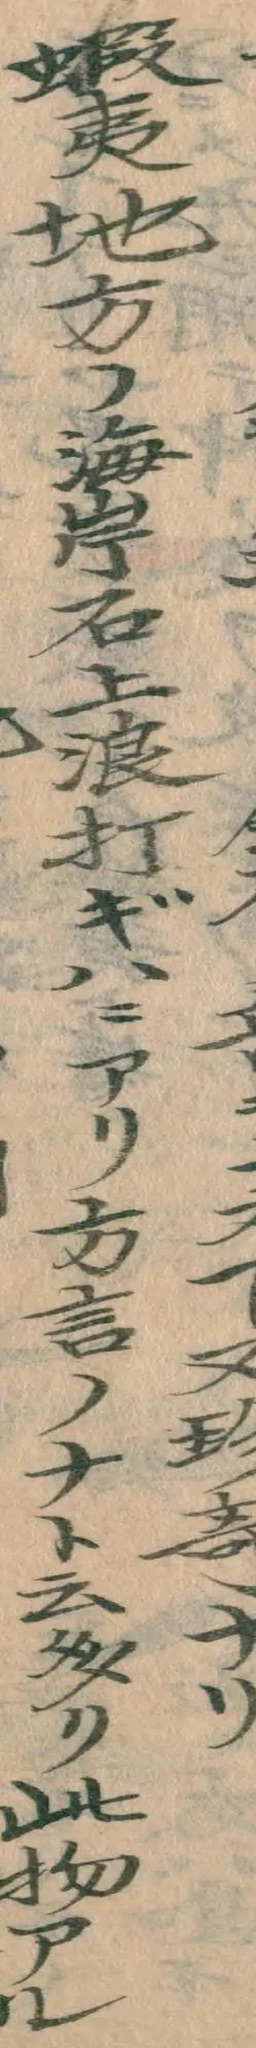蝦夷地方ノ海岸石上浪打ギハニアリ方言ノナト云多ク此物アル
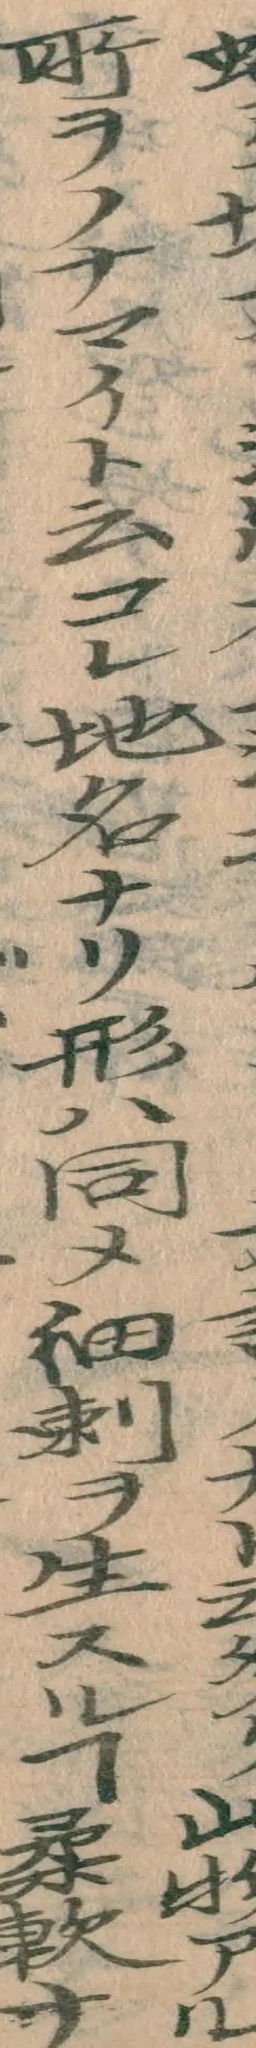所ヲノナマイト云コレ地名ナリ形ハ同シテ細刺ヲ生スルコト柔軟ナ
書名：千蟲譜 3巻. [2]
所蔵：国立国会図書館 National Diet Library, JAPAN
